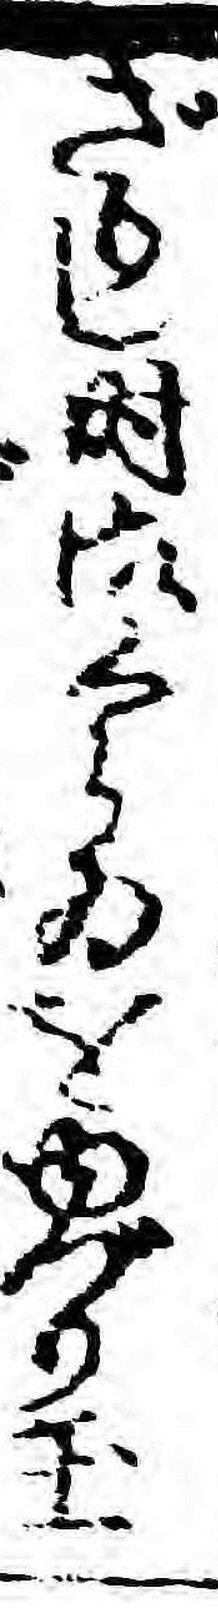ざりし時御くらゐをゆづり玉
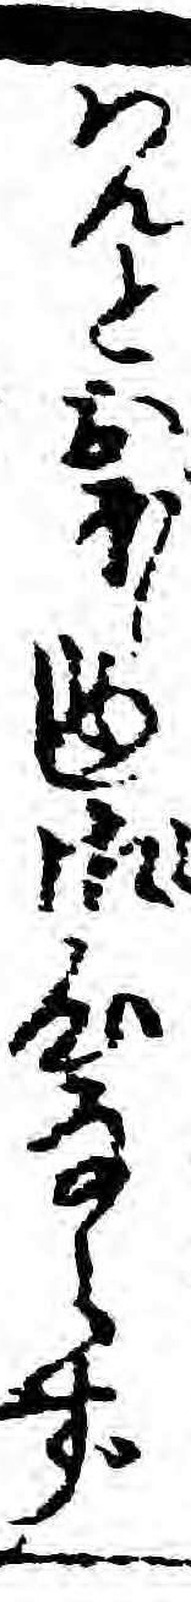はんとおぼしめし御心ならず
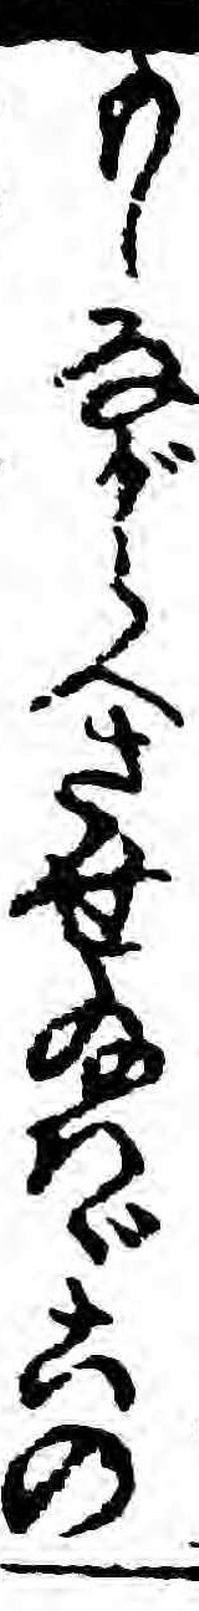もしながらへさせ給はゞこの
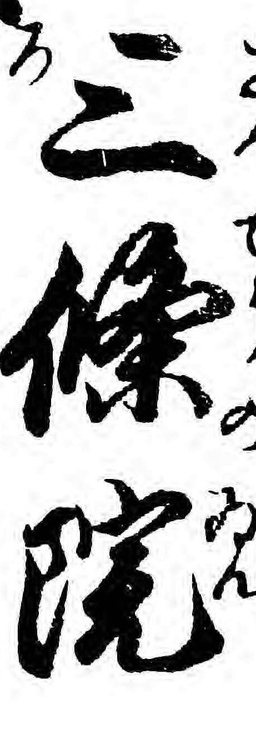三條院
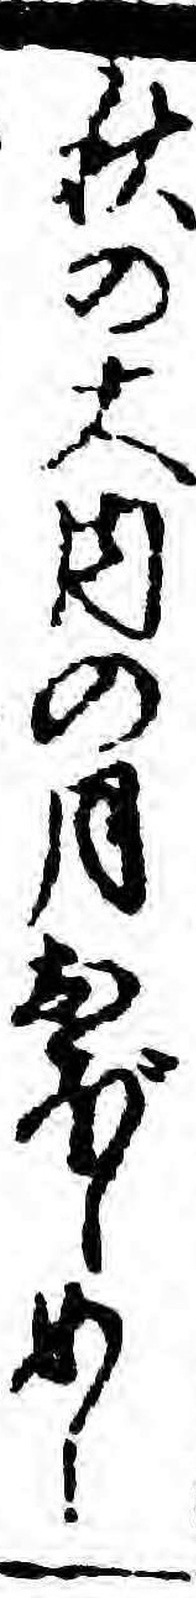秋の大内の月おぼしめし
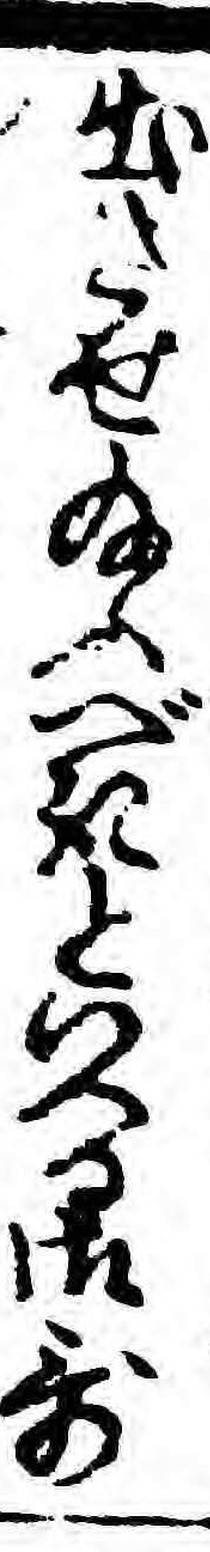出させ給ふべきといへる御哥
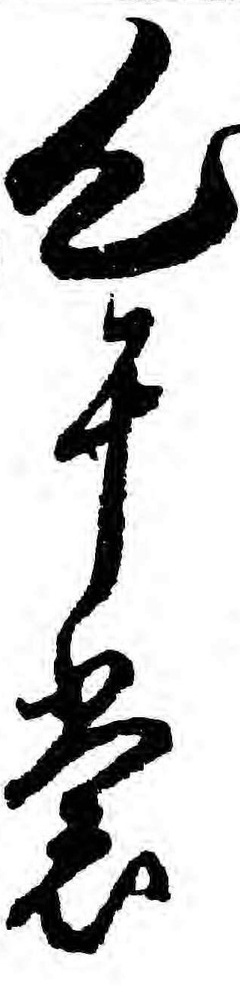心にも
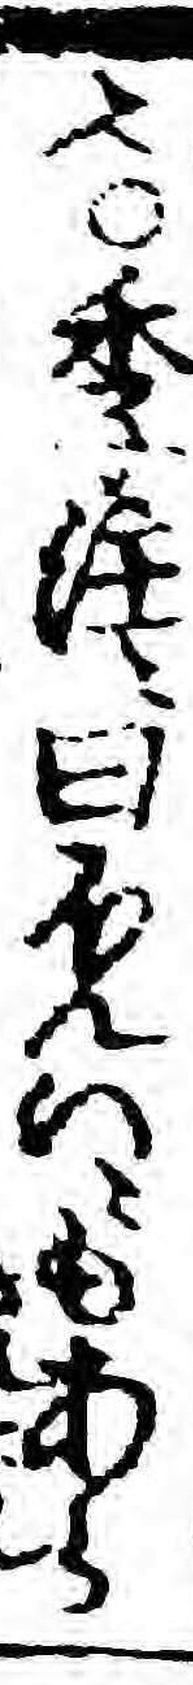也〇季注に曰ほんいにもあら
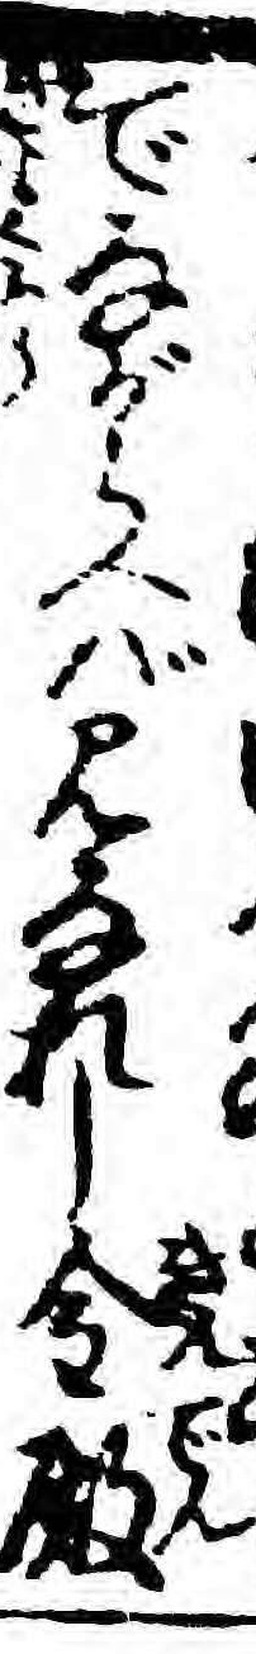でながらへば見なれし金殿
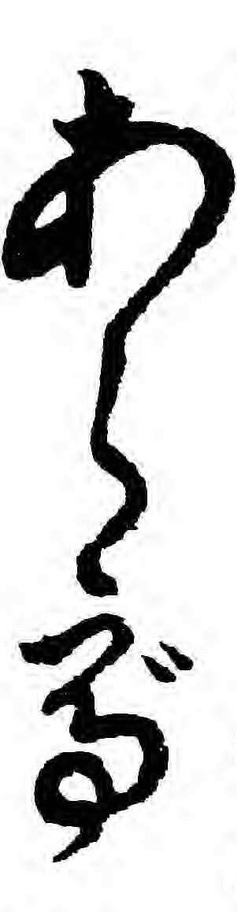あらで
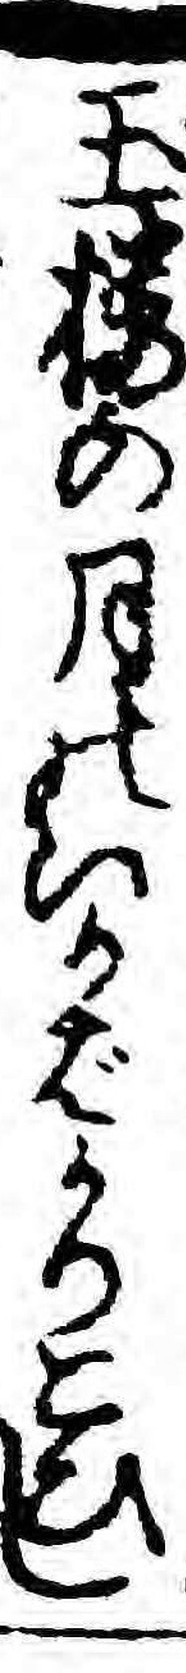玉楼の月のいかばかりこひし
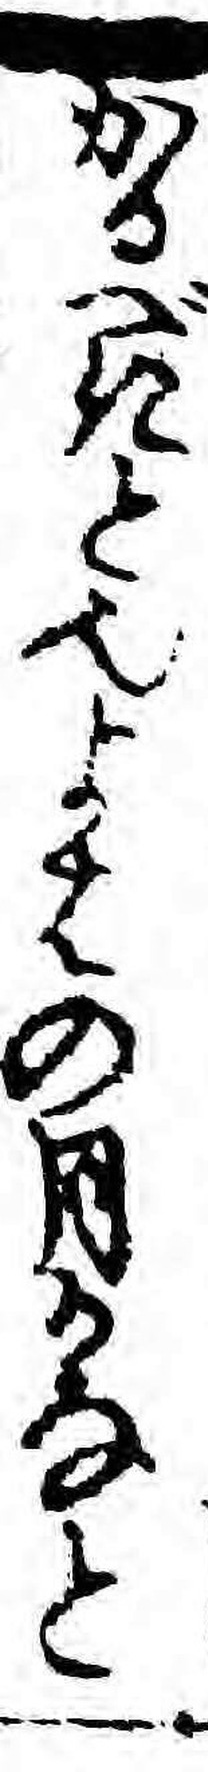かるべきと也よはの月かなと
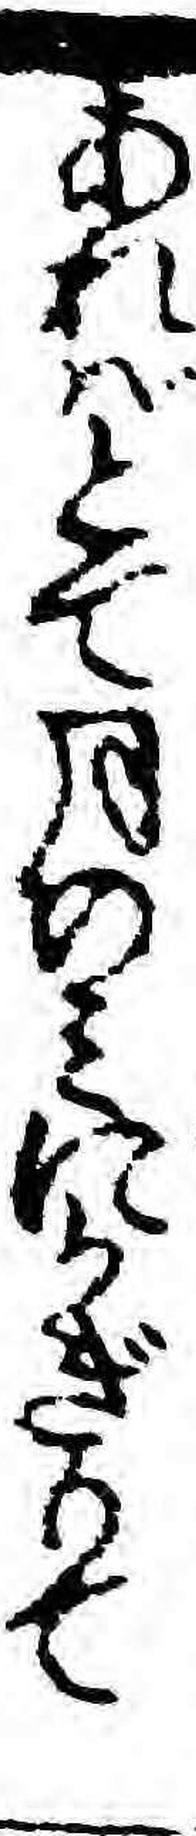あればとて月のみにかぎりて
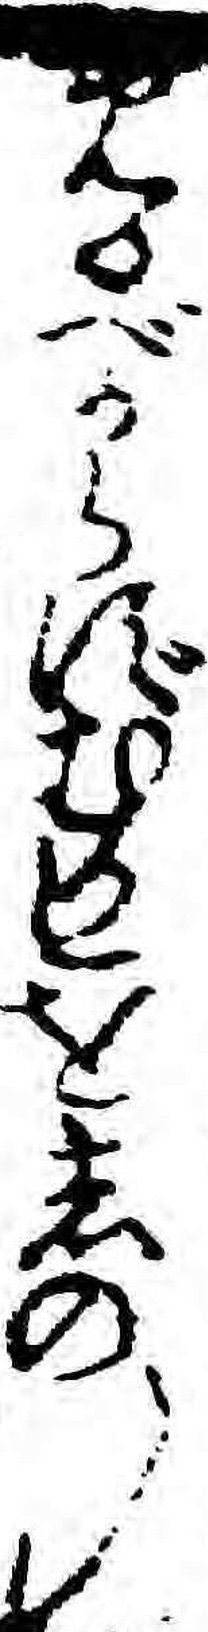みるべからずむかしをしの
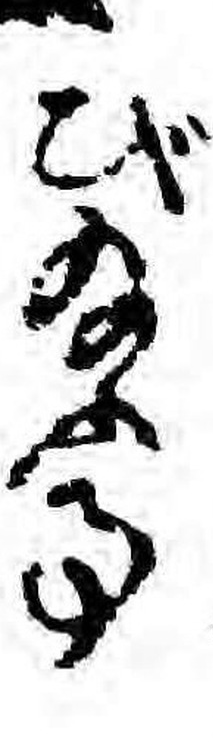び給ふ事
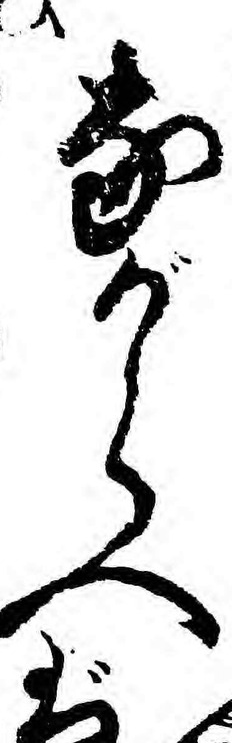ながらへば
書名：頭書和歌注譯／壽賀多百人一首小倉錦
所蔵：国文学研究資料館
